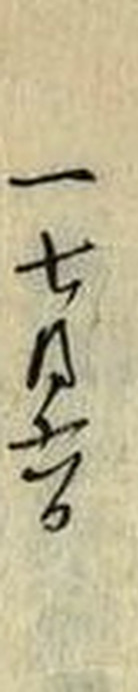一七月六日
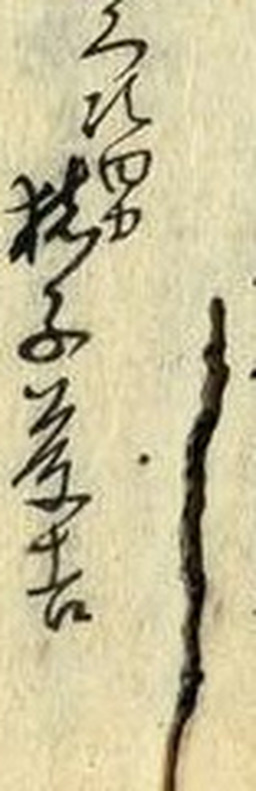猪子藤吉
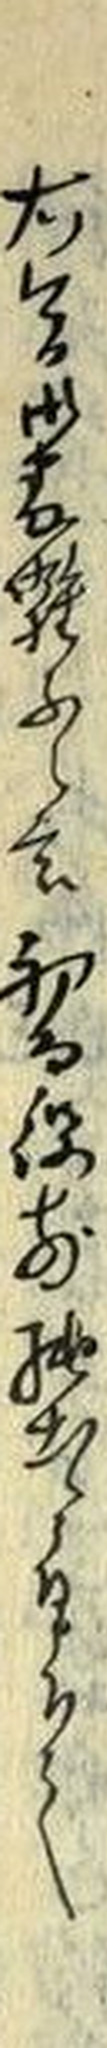右今日御番囃子之節初而役前罷出候ニ付被下之
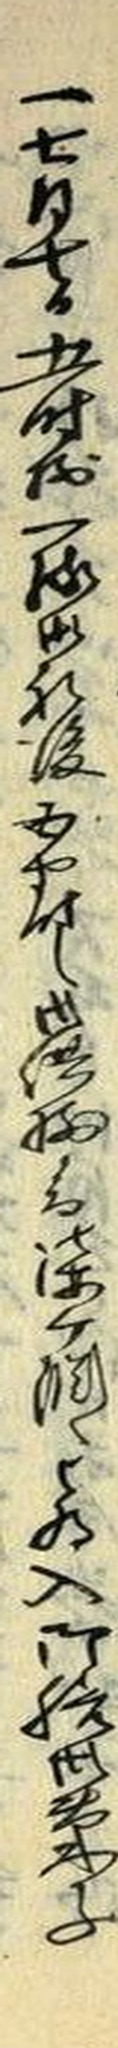一七月七日五時揃一統御礼後五半時御供揃ニ而漆ケ渕へ被為入御膳御菓子
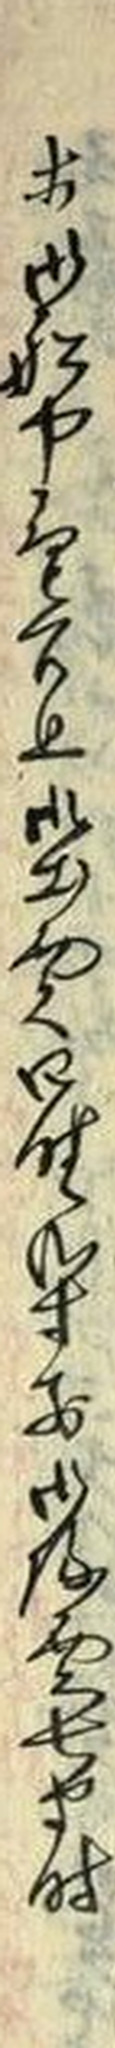等御船中ニ而も召上御出殿四時弐寸前御帰殿七半時
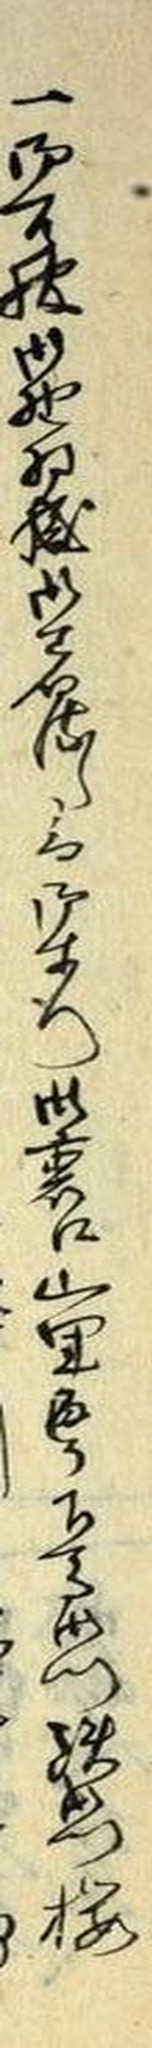一御召服御野羽織御着流しニ而御歩行御裏口山里通り下馬御門鉄御門桜
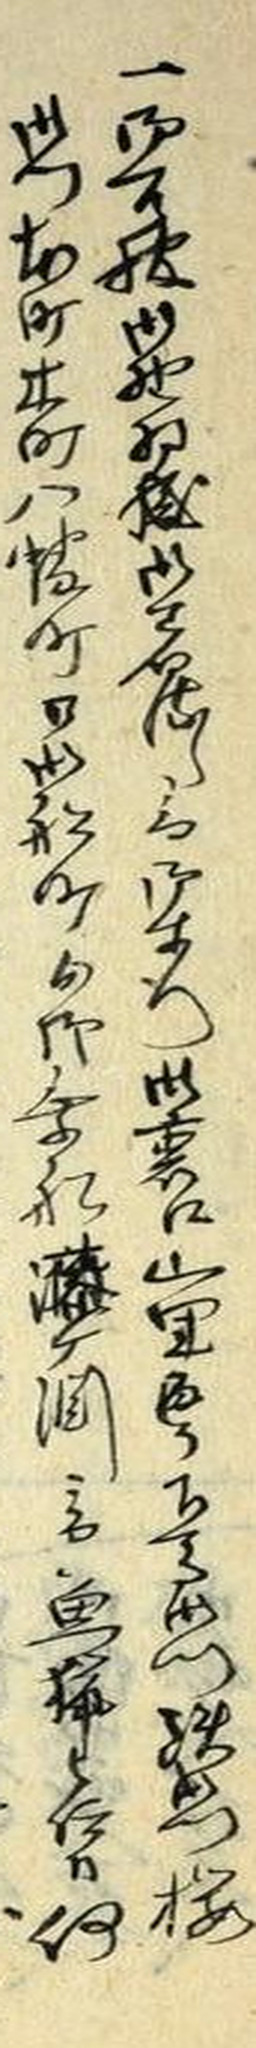御門本町木町八幡町同御船町ゟ御乗船漆ケ渕ニ而魚猟被仰付何
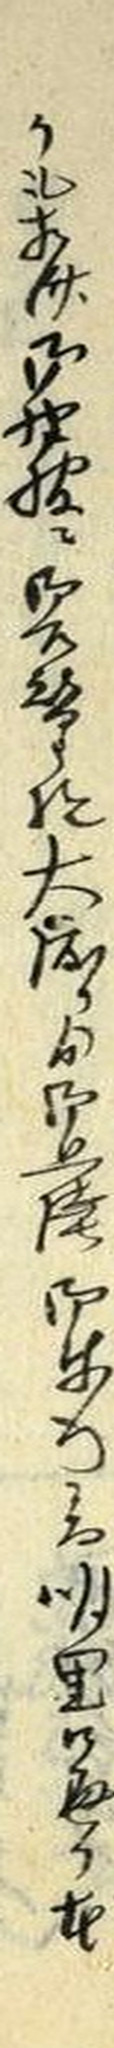かも相済御野服御召替被遊大渡りゟ御上陸御歩行ニ而明里口通り本
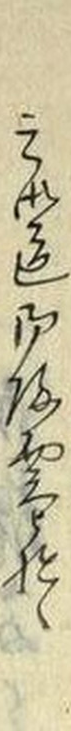之御道御帰殿被遊候
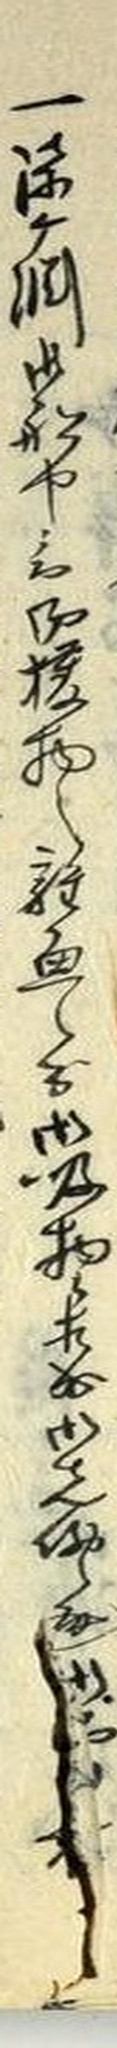一漆ケ渕御船中ニ而御獲物之雑魚之分御吸物ニ相成御先例之通御［］
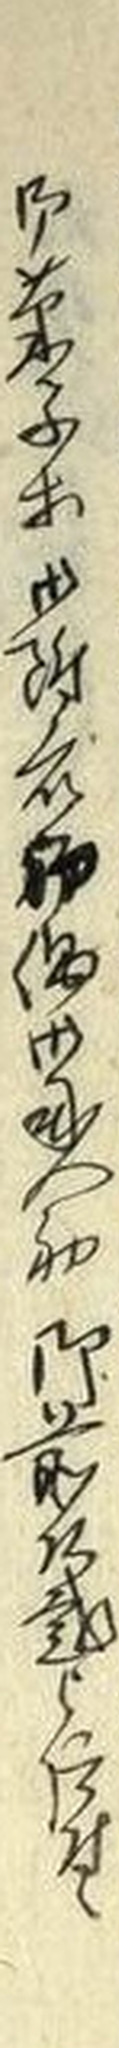御菓子等御附衆御側御用人初御前頂戴被仰付候
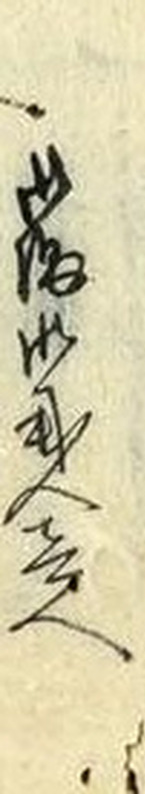御側御用人壱人
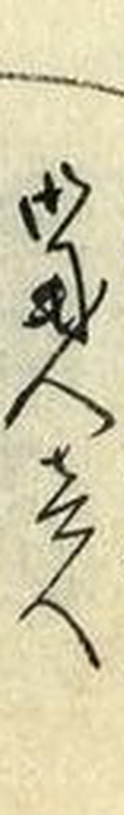御用人壱人
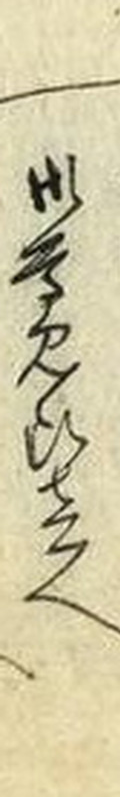御鳥見頭壱人
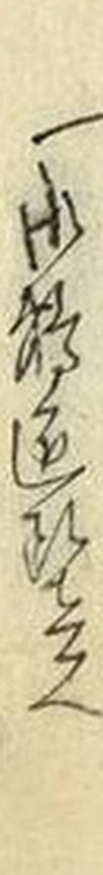御鵜匠頭壱人
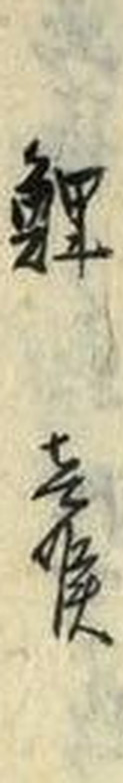鯉壱喉
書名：少傅日録抄（斉善付側向頭取日記、江戸并道中、初入在国、逝去後…
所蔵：福井県文書館 Fukui Prefectural Archives
